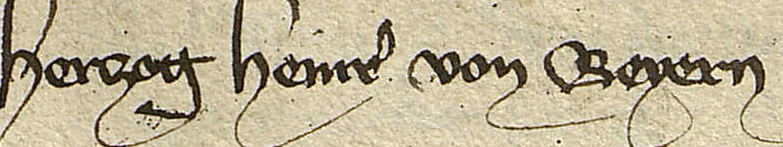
hercʒog heinr* von Beyern
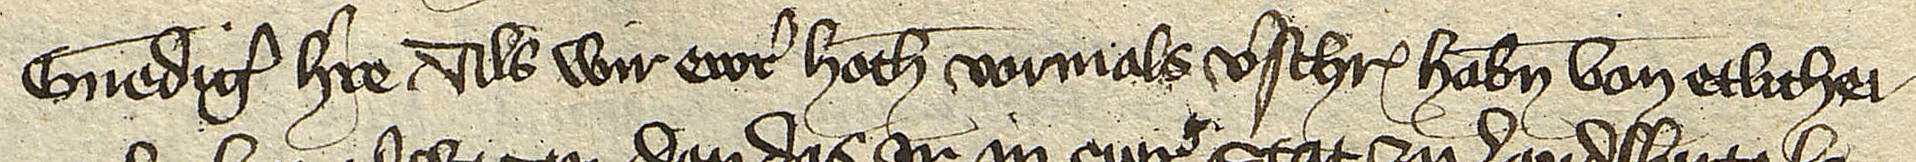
Gnedig* h*re / Als wir ewr* hoch* vormals v*ſchr* habn* von etlicher
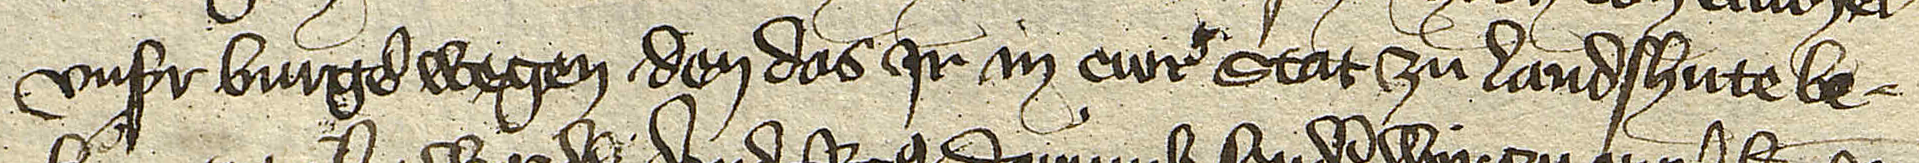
vnſ*r burge* wegen / den das Ir in ewr* Stat cʒu Landſhute be =
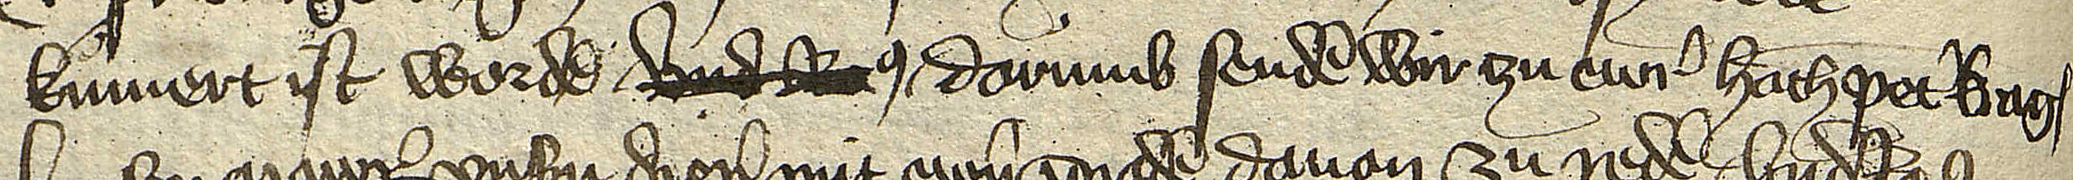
kümert iſt worde* / vnd Ro* / darümb ſende* wir cʒu ewr* hoch* pet* krag*
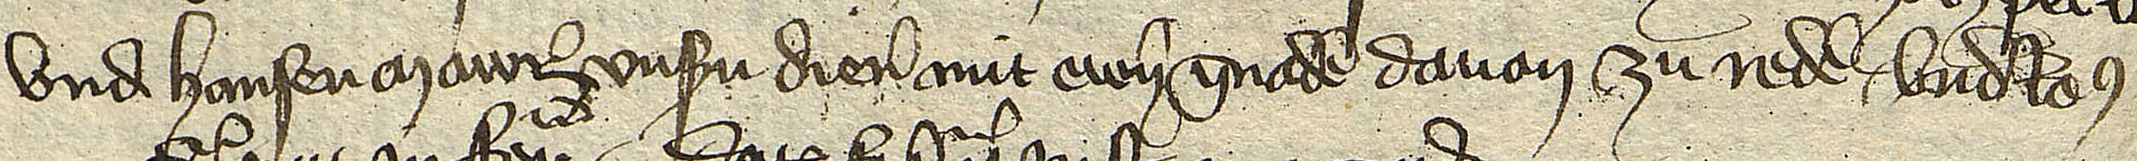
vnd hanſen Mawr* vnſ*n dien* mit ewn* gnad* dauon cʒu red* / vnd Ro*
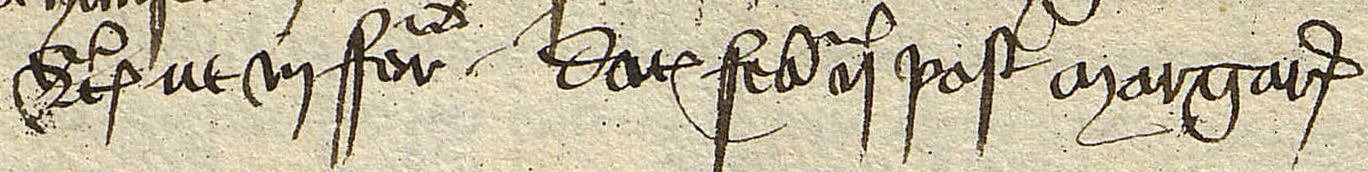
ec* ut in for* / dat* fea* ii* poſt Margar*
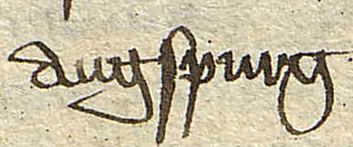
Augſpurg
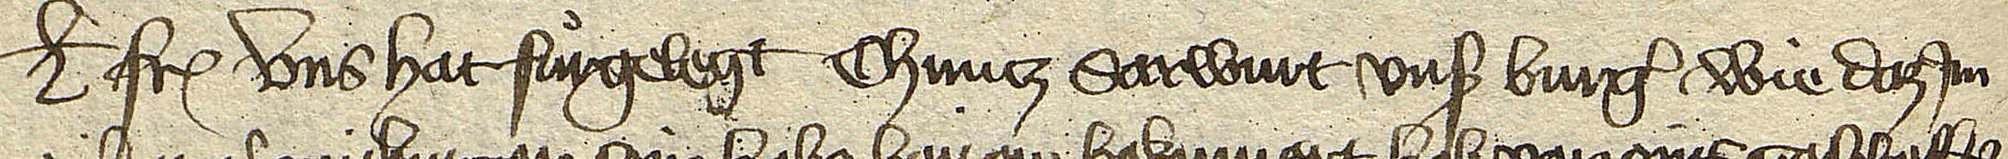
L* fr* / Vns hat fürgelegt Chuncʒ Sarwurt vnſ* burg* / wie daʒ Im
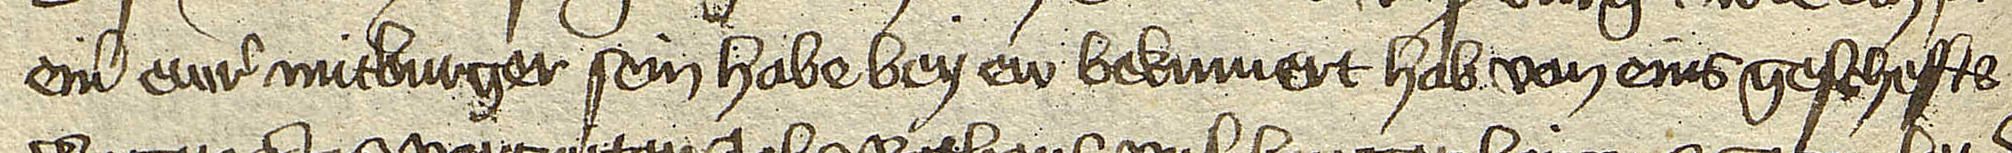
ein* ewr* mitburger ſein habe bey ew bekumert hab von eins geſcheffts
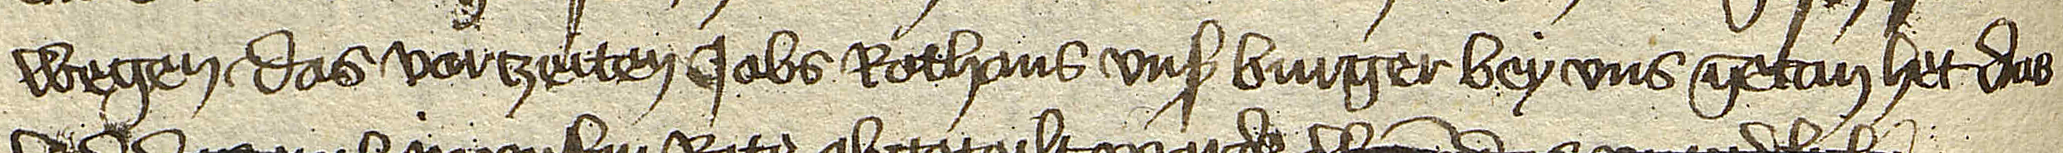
wegen / das vorcʒeiten Iobs Rothans vnſ* burger bey vns getan het das
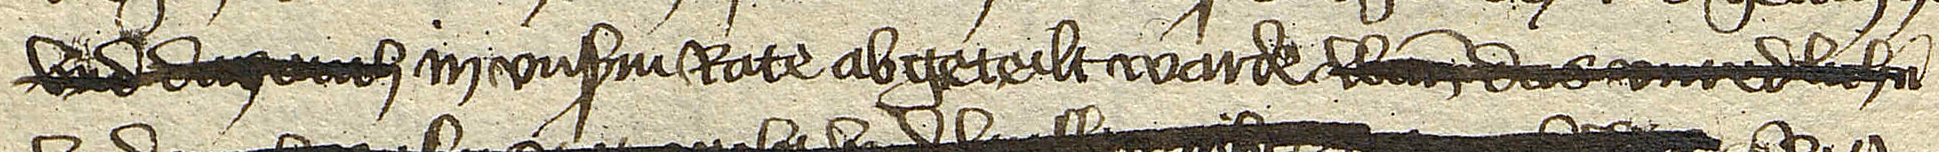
vnd dan* auch in vnſ*m Rate abgeteilt worde / wan* das vnredlichn*
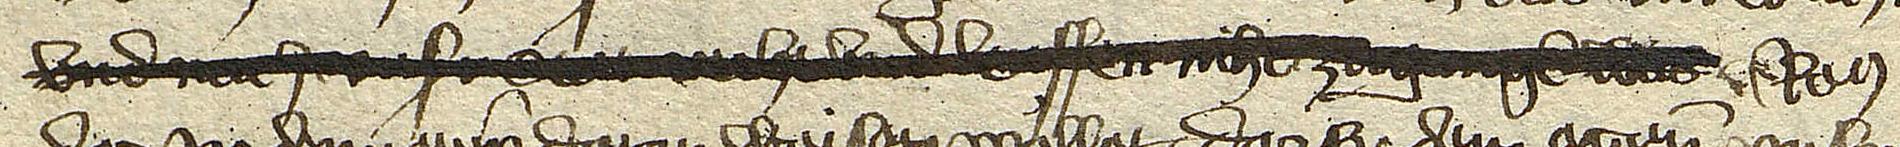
vnd nach vnſ*r Stat recht vnd leuffen niht cʒugange* was / Ro*
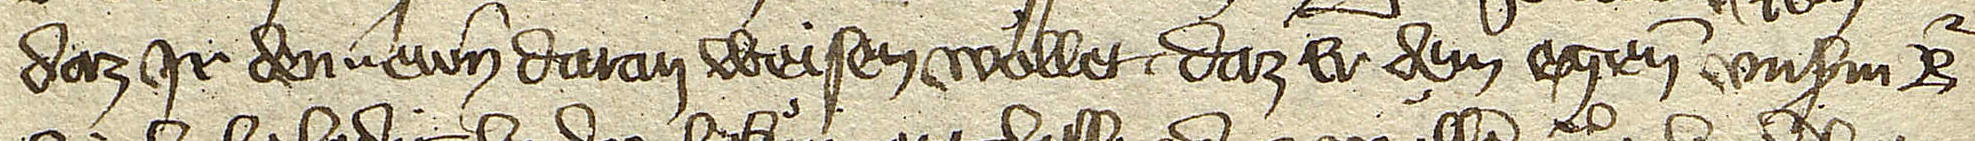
daʒ Ir den ~ ew*n daran weiſen wöllet / daʒ er dem egen* vnſ*m B*
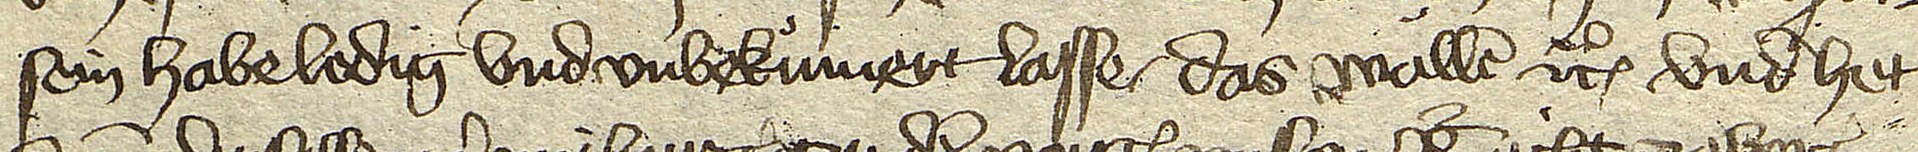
ſein habe ledig vnd vnbekümert laſſe / das wölle ec* / vnd het
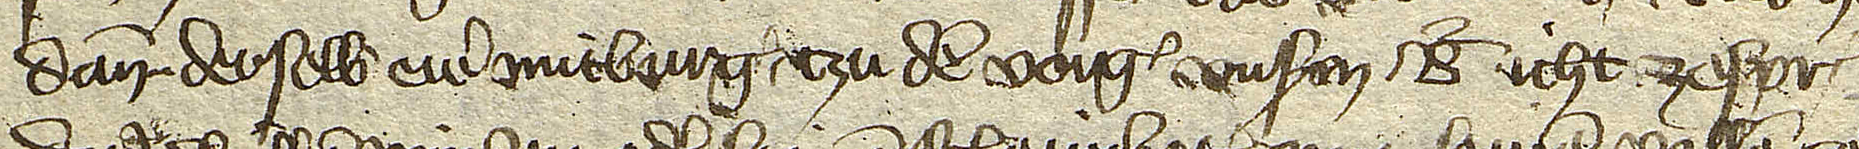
dan* ~ derſelb* ew* mitburg* cʒu de* vorg* vnſ*en B* icht cʒeſpr*
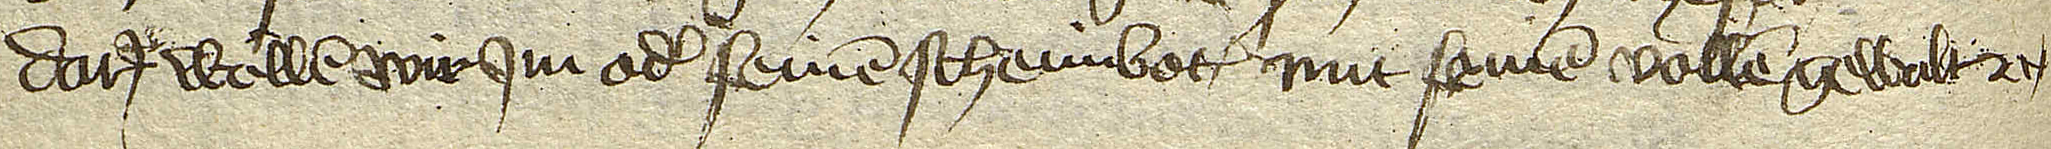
dar* wölle* wir Im od* ſeine* ſcheimbot* mit ſeine* volle* gewalt ec*
